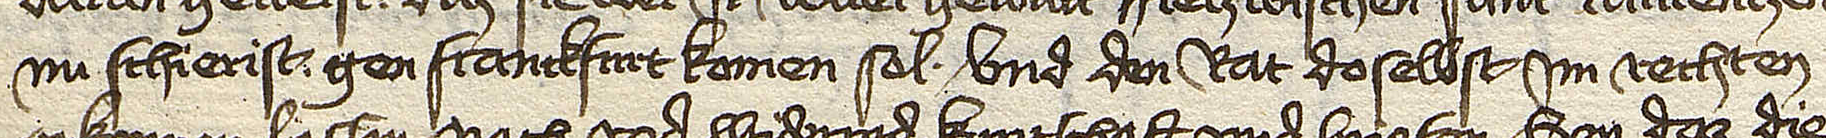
nu ſchieriſt . gen franckfurt komen ſol . / Vnd den Rat doſelbſt Im rechten
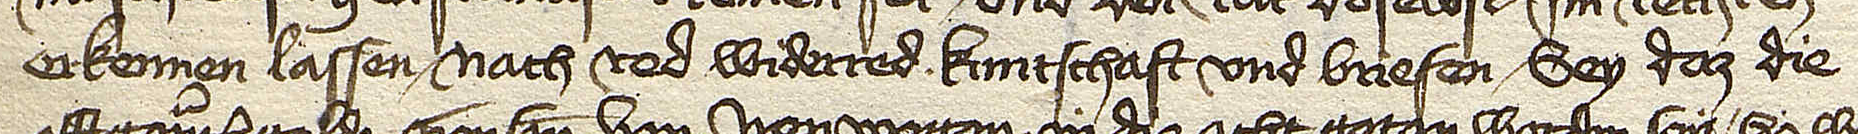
erkennen laſſen / Nach red widerred . kuntſchaft vnd briefen / Sey daʒ die
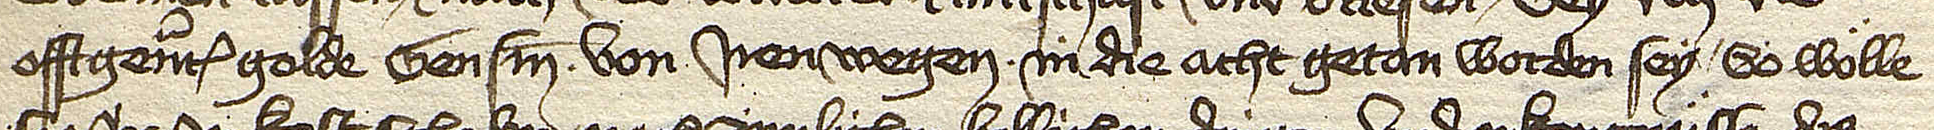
offtgen*t* golde Genſin* . von Iren wegen . in die acht getan worden ſey / So wölle
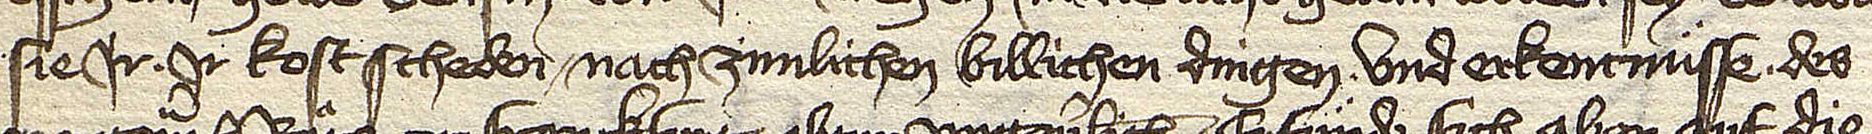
ſie Ir . Ir koſt ſcheden / nach cʒimlichen billichen dingen . vnd erkentnüſſe . des
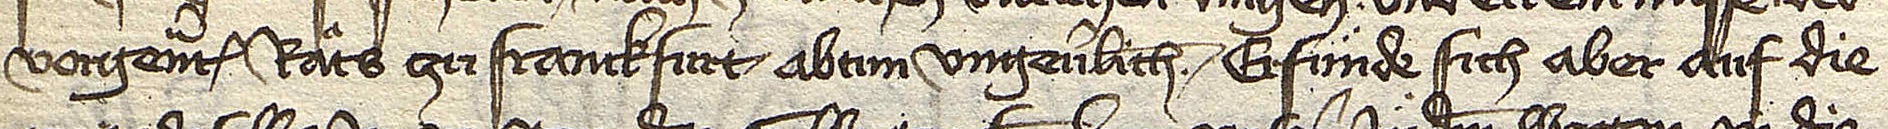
vorgen*t* Räts cʒu frankfurt abtun vngen*lich* . Erfünde ſich aber auf die
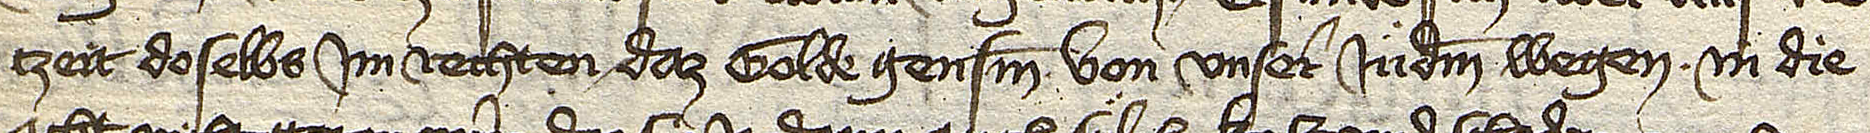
cʒeit doſelbs Im rechten / daʒ Golde genſin* von vnſer* Iüdin* wegen . in die
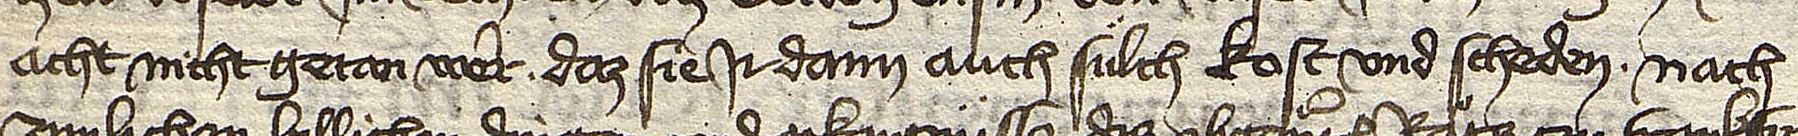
acht nicht getan wer* . daʒ ſie Ir dann auch ſülch koſt vnd ſcheden . nach
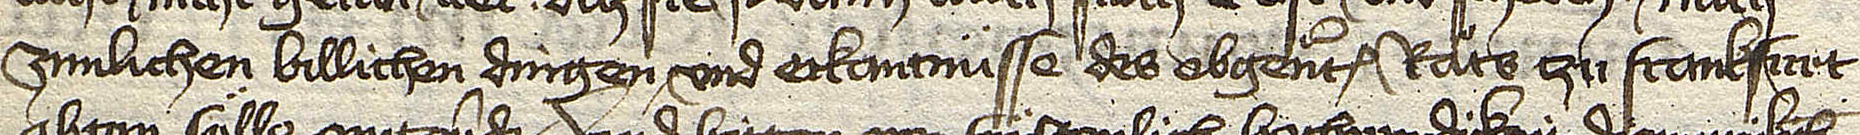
cʒimlichen billichen dingen vnd erkantnüſſe des obgen*t* Räts cʒu frankfurt
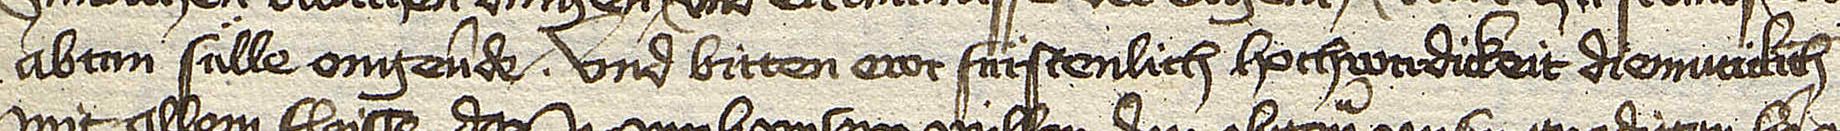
abtun ſülle ongeu*de / . Vnd bitten ewr fürſtenlich hochwirdickeit diemuticlich*
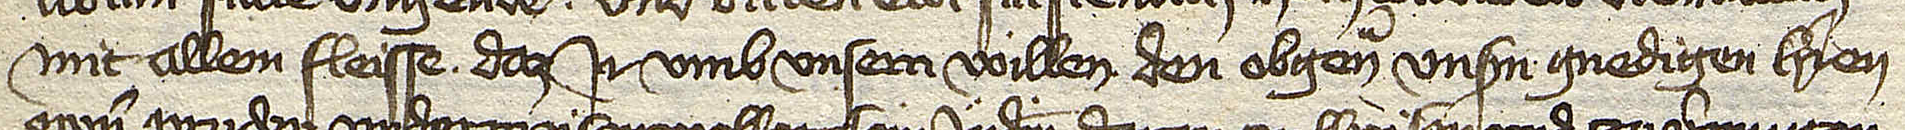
mit allem fleiſſe . daʒ Ir vmb vnſern willen . den obgen* vnſ*n gnedigen h*ren
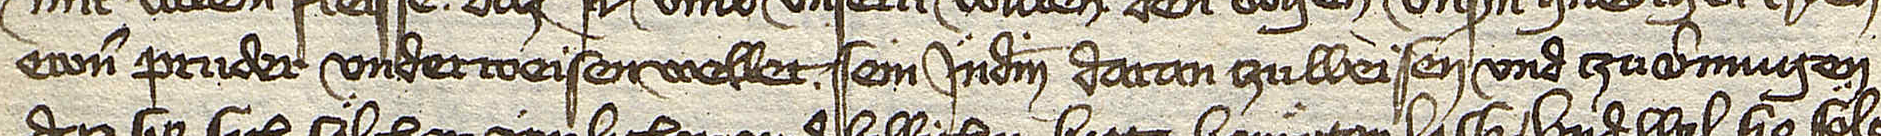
ew*n pruder vnderweiſen wellet . ſein Iüdin* daran cʒu weiſen vnd cʒuv*mugen
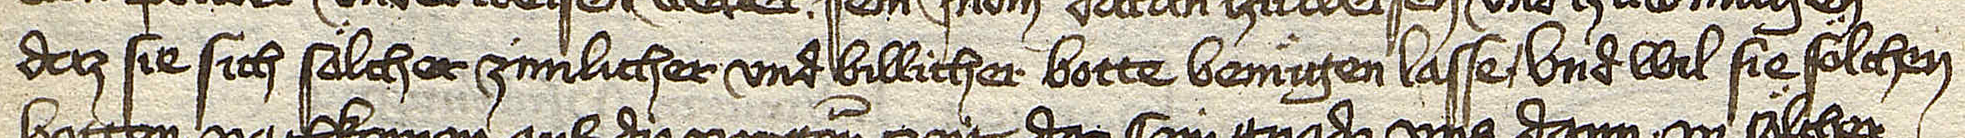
daʒ ſie ſich ſölcher cʒimlicher vnd billicher botte benügen laſſe . / vnd wil ſie ſölchen
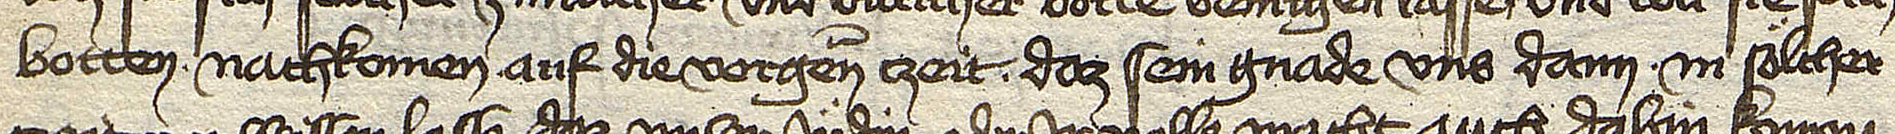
botten . nachkomen auf die vorgen* cʒeit . daʒ ſein gnade vns dann . in ſölcher
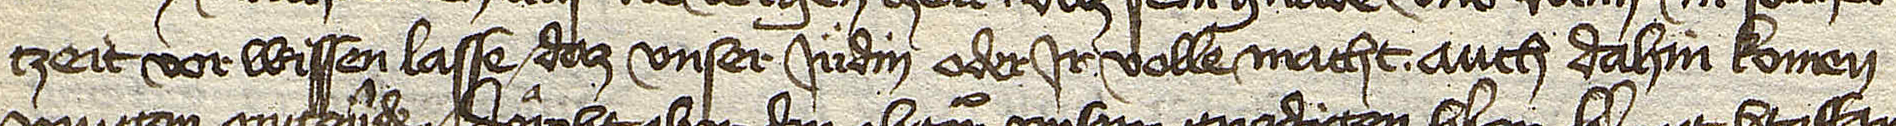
cʒeit vor wiſſen laſſe / daʒ vnſer Iüdin oder Ir volle macht . auch dahin komen
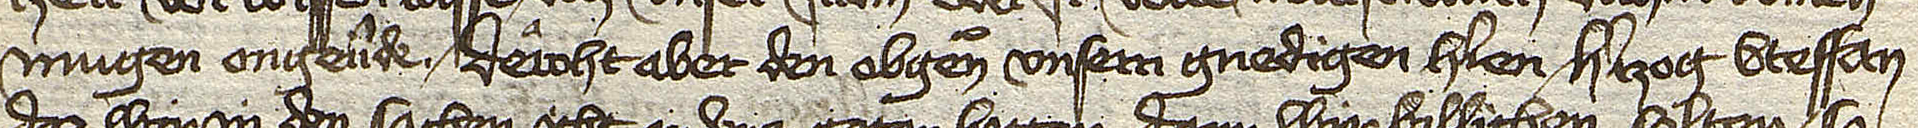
mugen ongeu*de . / Deẅht aber den obgen* vnſern gnedigen h*ren / h*cʒog Steffan
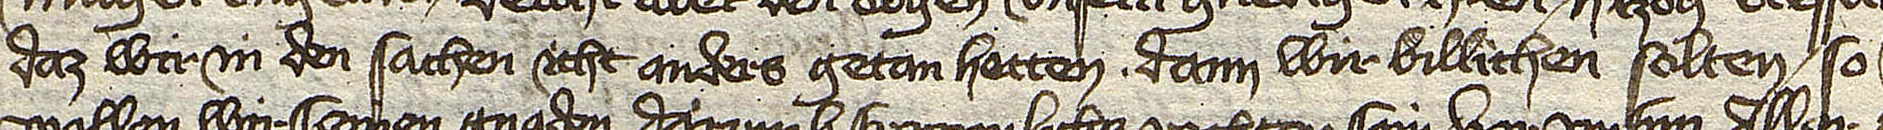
daʒ wir in den ſachen icht anders getan hetten . dann wir billichen ſolten / ſo
